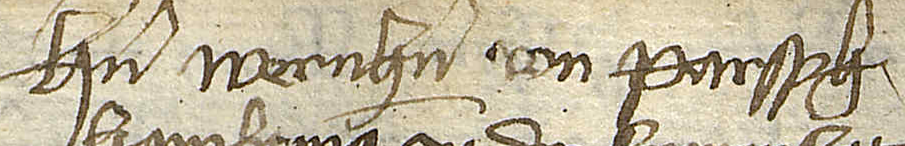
Hn* Wernhn* von Parſp*g
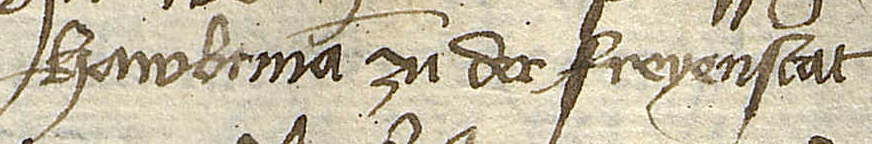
Hawbtma* ʒu der freyenſtat
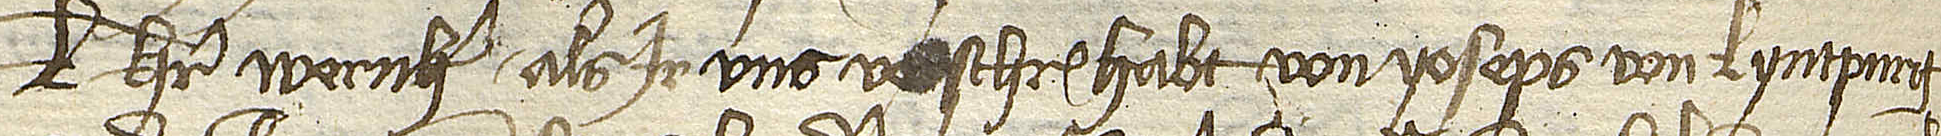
L* Hr* wernh* / als Ir vns verſchr* habt von yoſeps von Lyntpurg
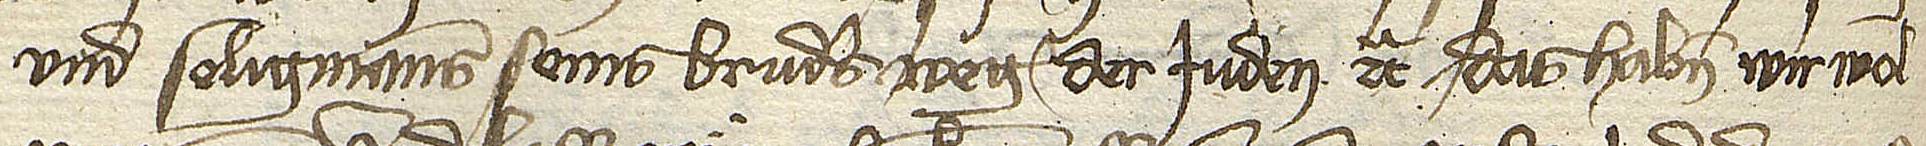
vnd ſeligman*s ſeins brud*s weg* der Iuden ec* / Das habn* wir wol
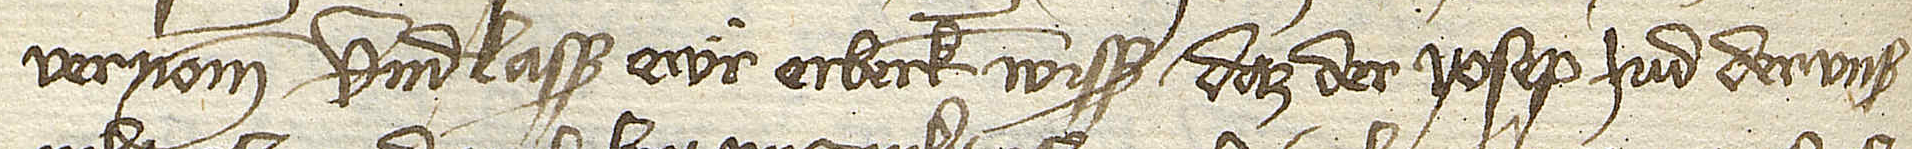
vernom* Vnd laſſ* eẅr erberk* wiſſ* / daʒ der Yoſep Iud der vnſ*
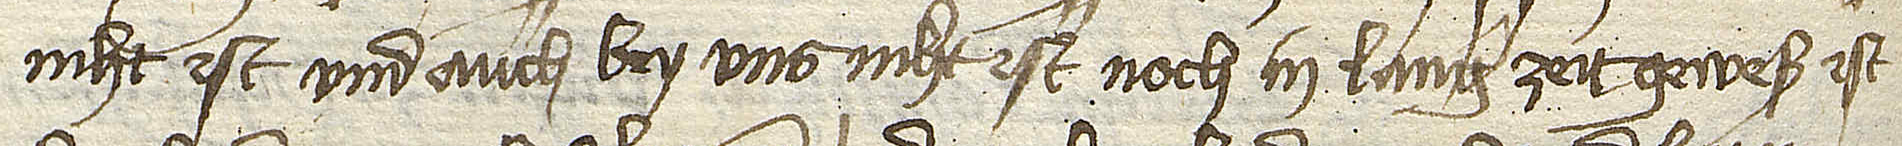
niht iſt vnd auch bey vns niht iſt noch in lang* ʒeit geweſ* iſt
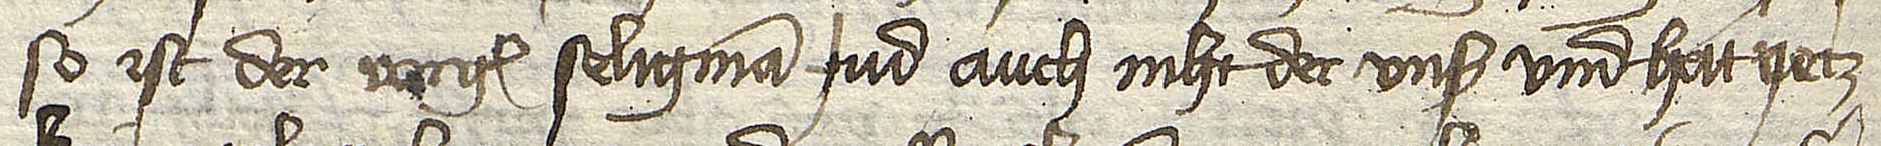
ſo iſt der vorg* ſeligma* Iud auch niht der vnſ* vnd hat yecʒ
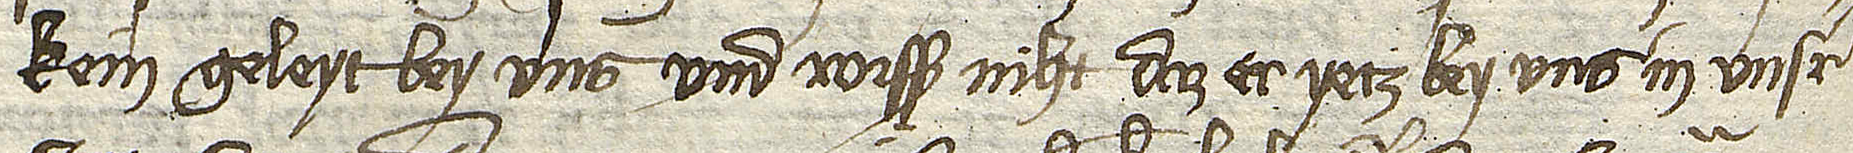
kein geleyt bey vns vnd wiſſ* niht daʒ er yecʒ bey vns in vnſr*
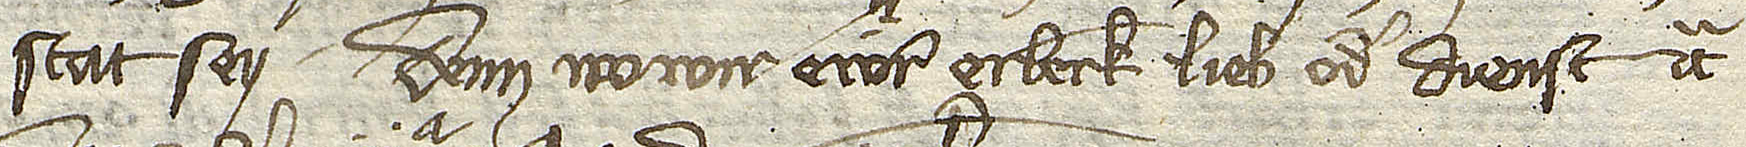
ſtat ſey / Denn wo wir eẅr* erberk* lieb od* dienſt ec*
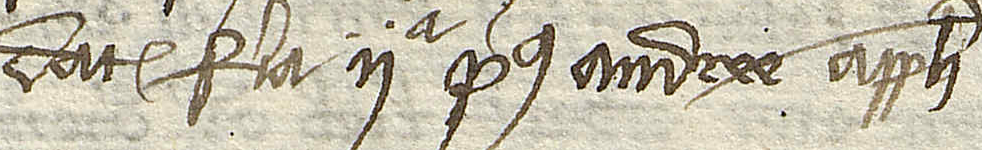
Dat* fi*a ii* p* andree appli*
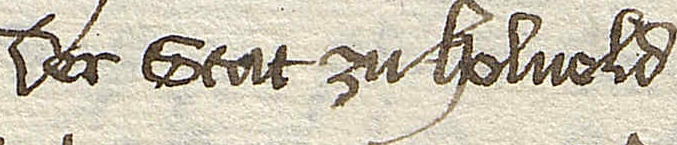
Der Stat ʒu holueld
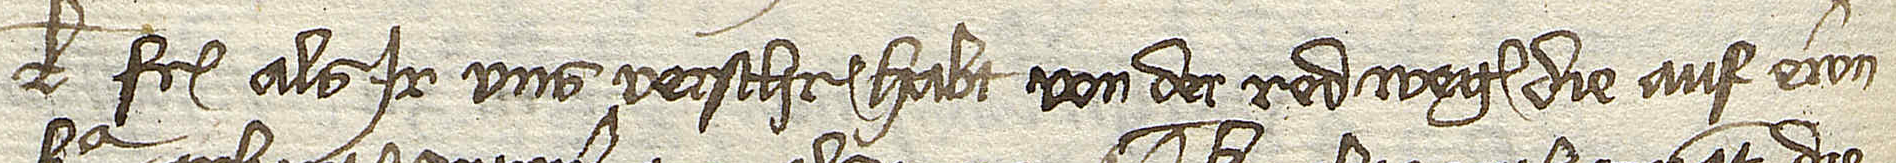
L* fr* als Ir vns verſchr* habt von der red weg* die auf ew*n
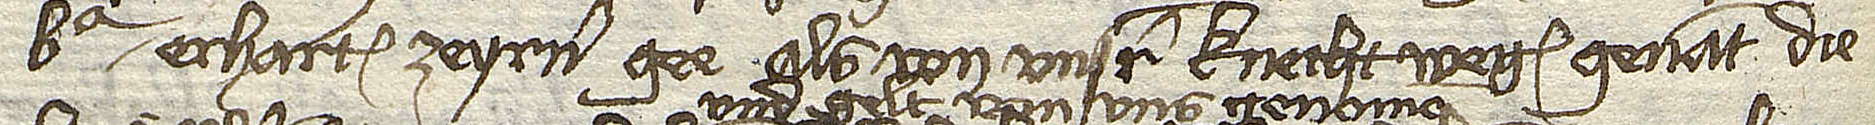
b* / erhart* ʒeyrn* gee . als von vnſr* knecht weg* gena*t die
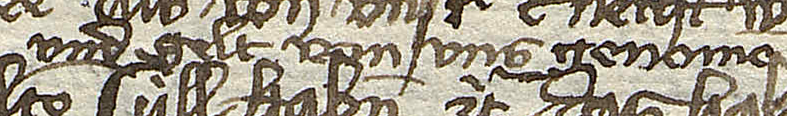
vnd gelt von vns genome*
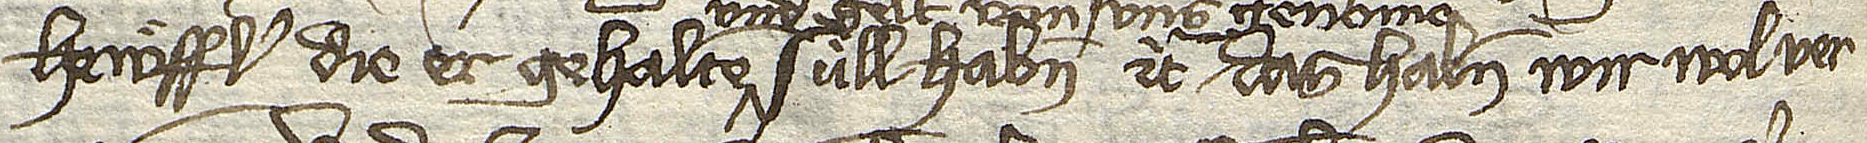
heẅffl* die er gehalte* ſüll habn* ec* / das habn* wir wol ver
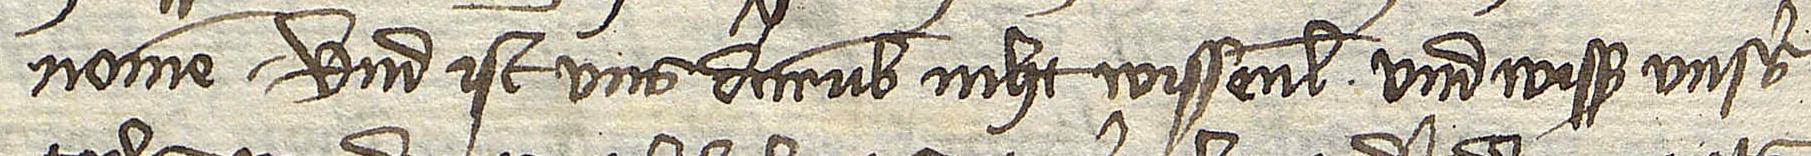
nome* / Vnd iſt vns darub* niht wiſſenl* . vnd wiſſ* vnſ*s
